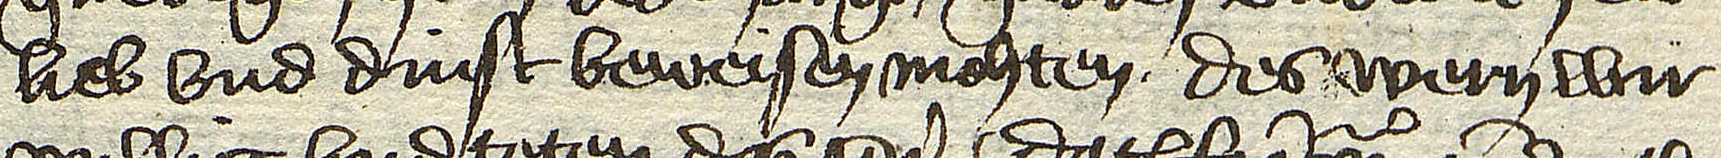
lieb vnd dinſt beweiſen mohten . des wern wir
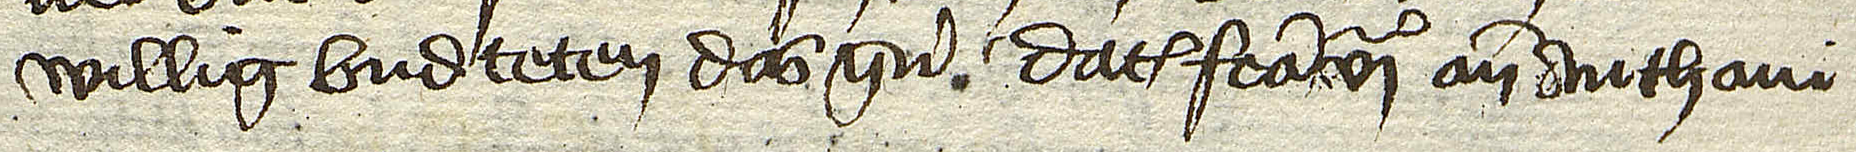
willig vnd teten das g*n / Dat* f*ia vi* an* Anthoni
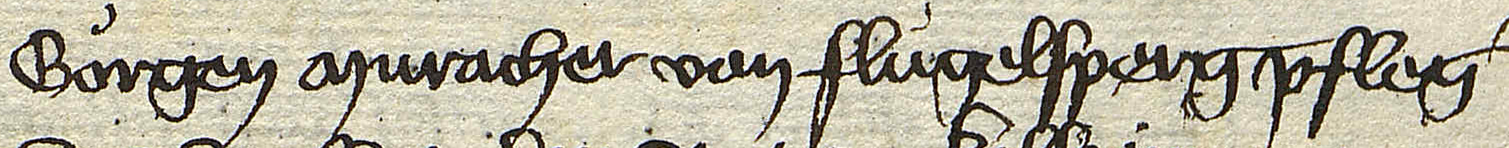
Görgen Muracher von flügelſperg pfleg*
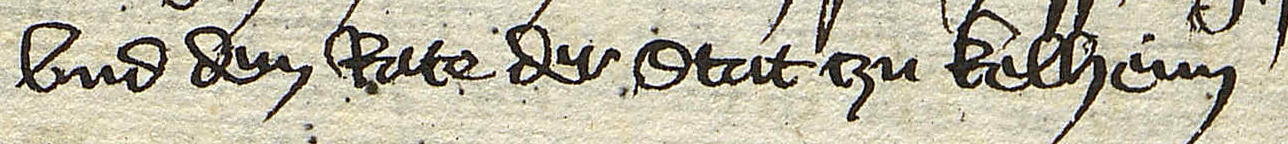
vnd dem Rate der Stat cʒu kelheim
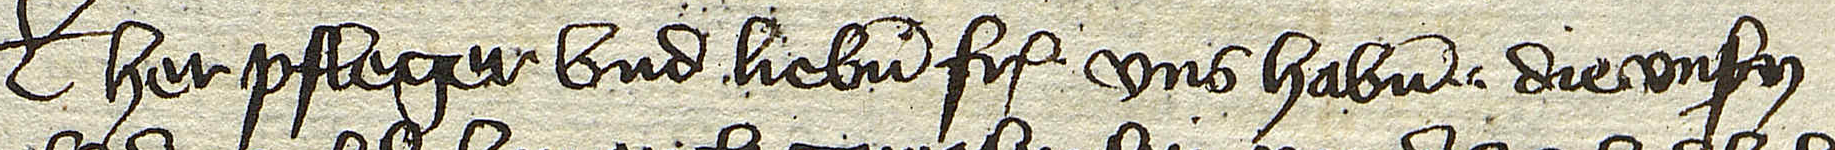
L* her pfleger Vnd lieb*n fr* vns hab*n . die vnſ*n
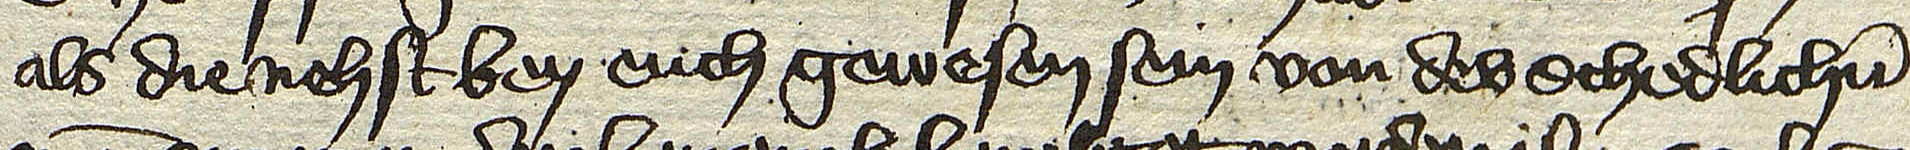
als die nehſt bey euch geweſen ſein von des Schedlich*n
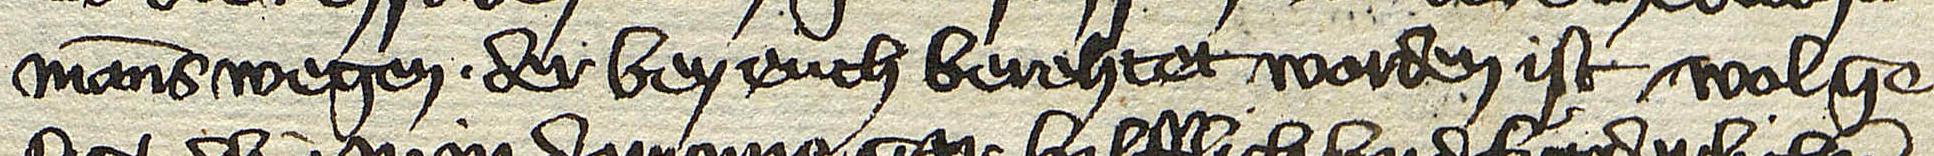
mans* wegen . der bey euch berehtet worden iſt wol ge -
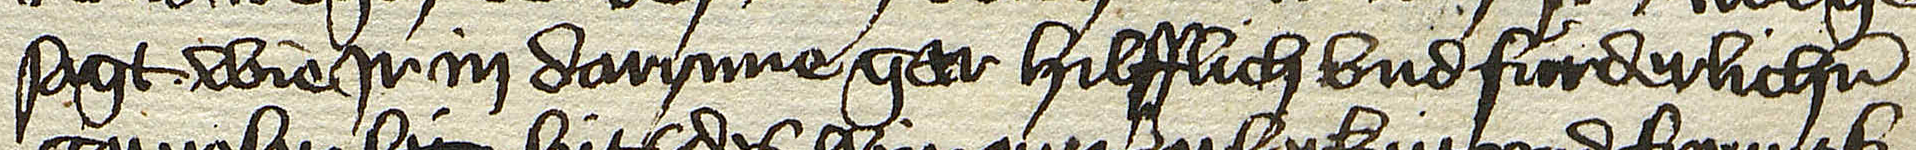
ſagt . Wie Ir in darynne gar hilfflich vnd fürderlich*n
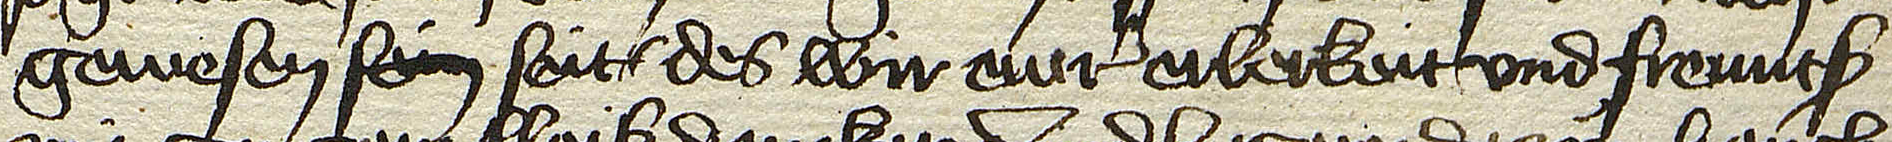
geweſen ſein ſeit / des wir ewr* erberkeit vnd freuntſ*
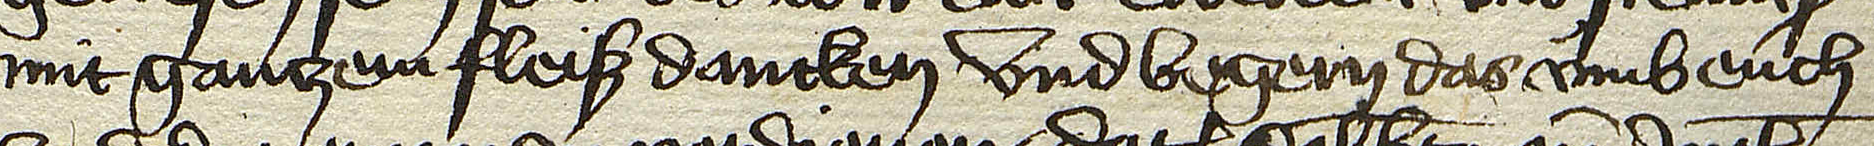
mit gancʒem fleiſʒ dancken Vnd begern das v̈mb euch
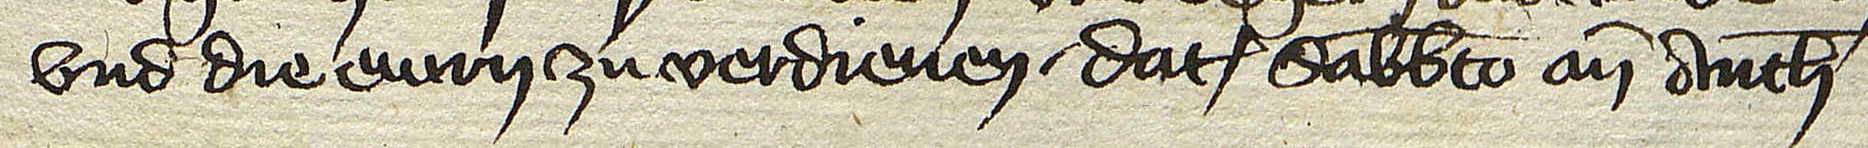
vnd die ewrn cʒu verdienen / Dat* Sabb*to an* Anth*
